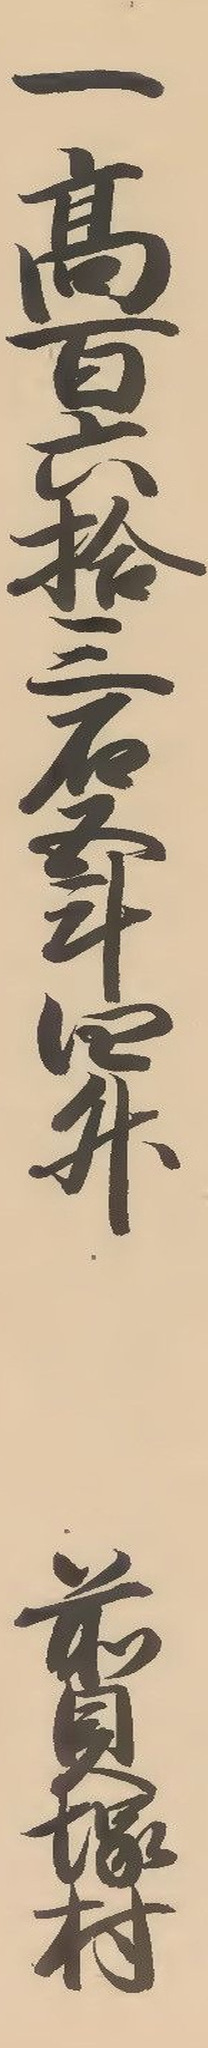一高百六拾三石五斗四升前貝塚村
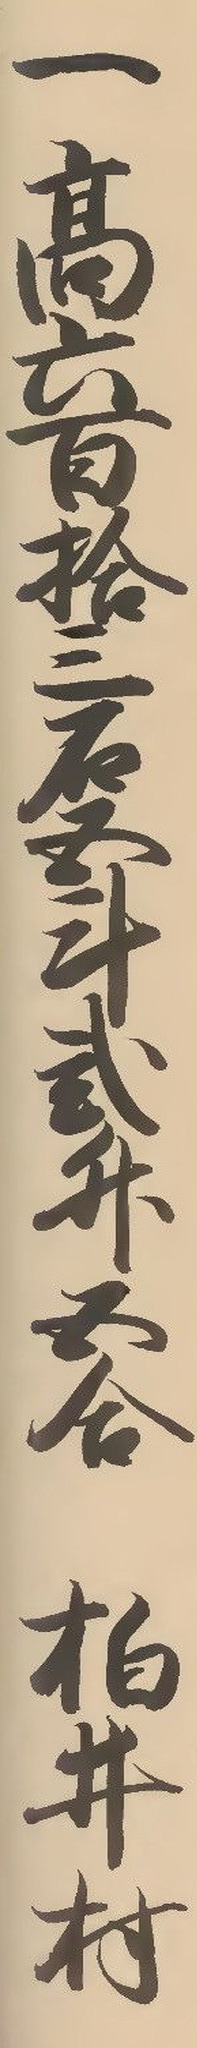一高六百拾三石五斗弐升五合柏井村
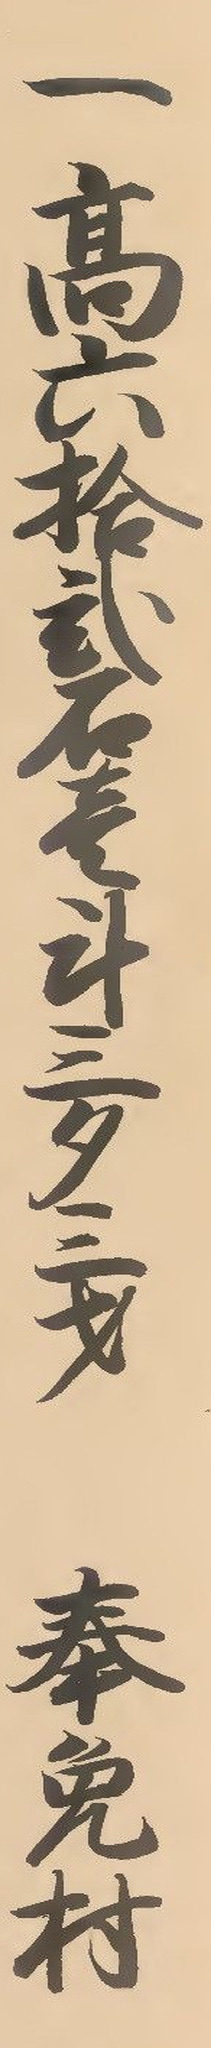一高六拾弐石壱斗三勺三才奉免村
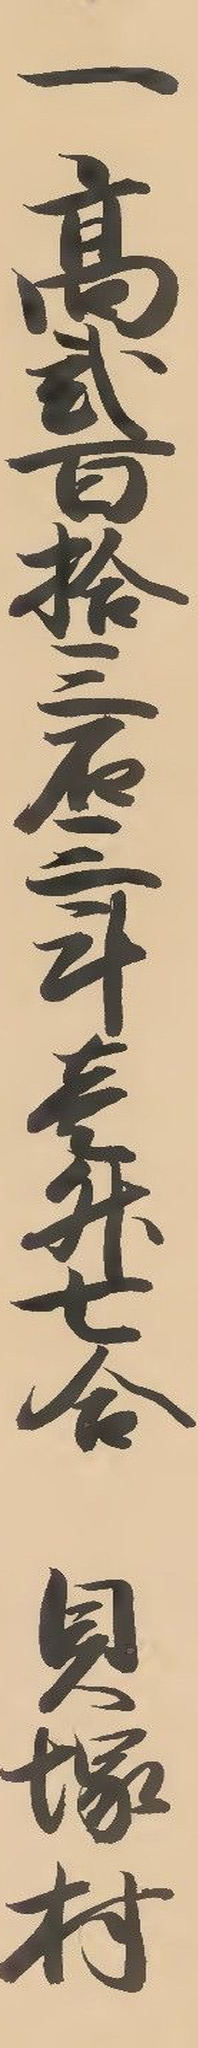一高弐百拾三石三斗壱升七合貝塚村
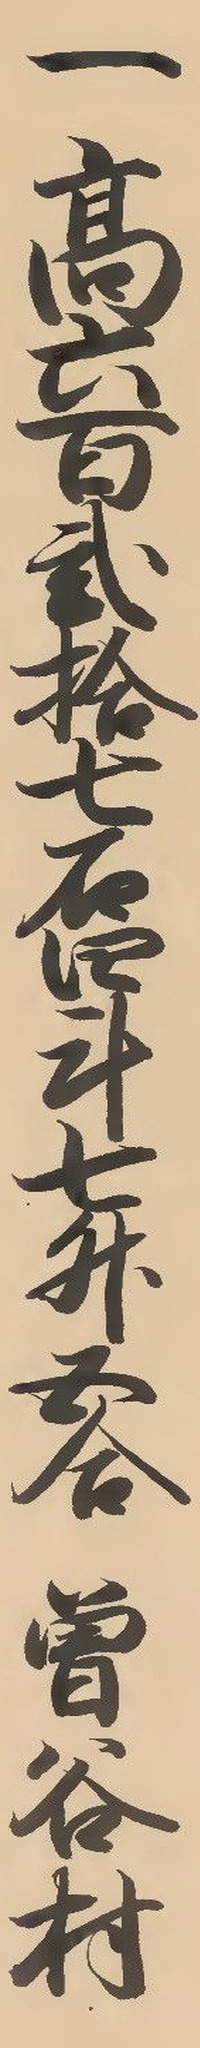一高六百弐拾七石四斗七升五合曽谷村
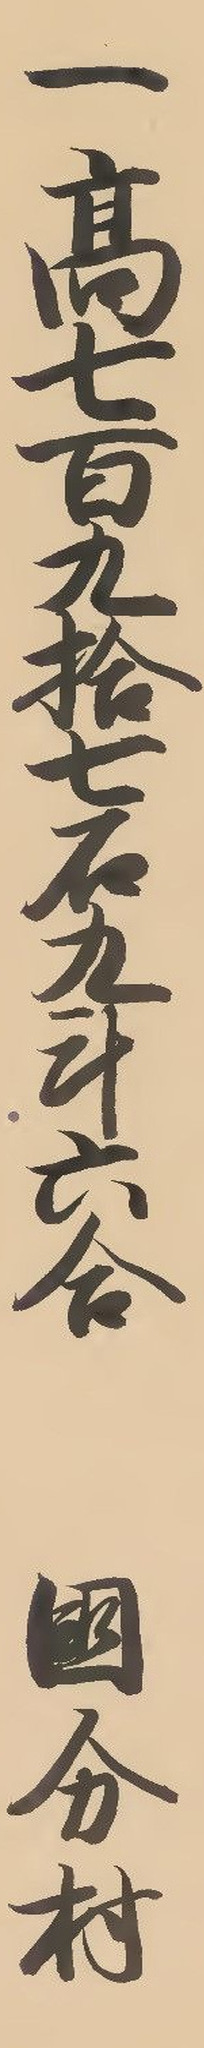一高七百九拾七石九斗六合国分村

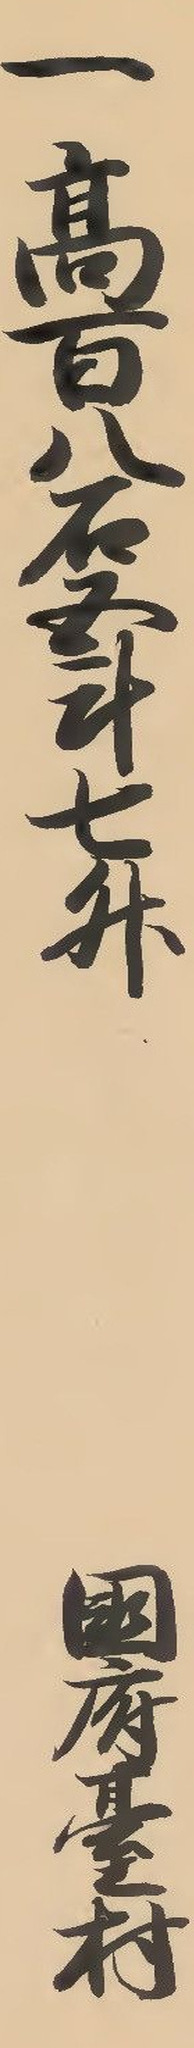一高百八石五斗七升国府台村
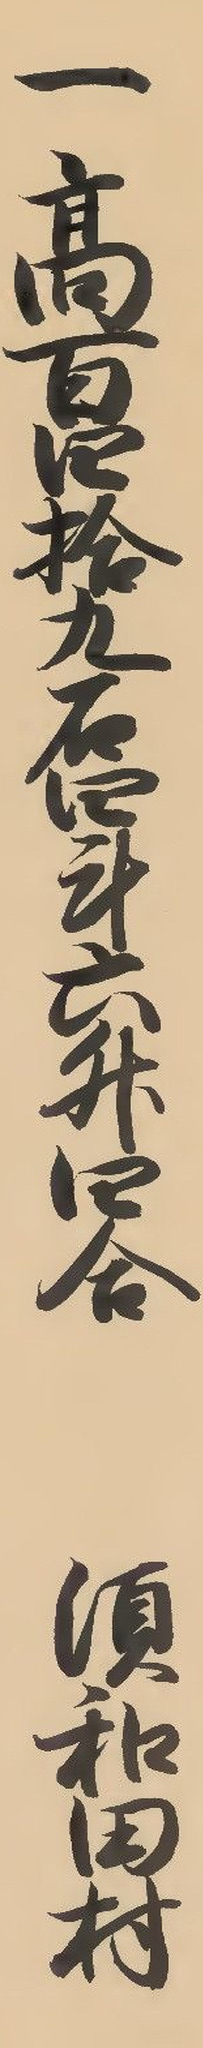一高百四拾九石四斗六升四合須和田村
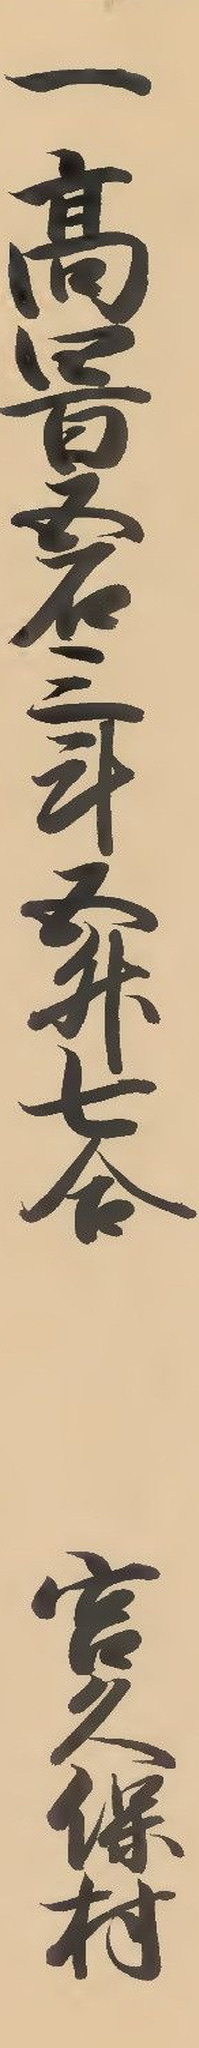一高四百五石三斗五升七合宮久保村
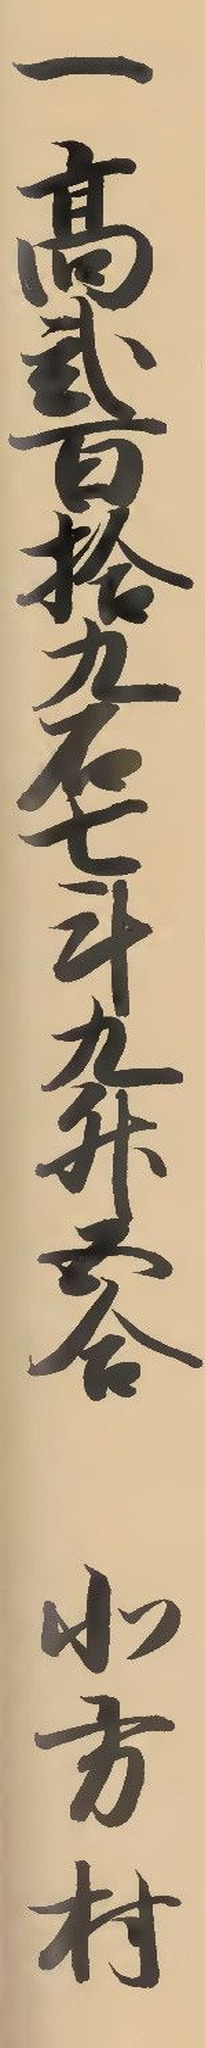一高弐百拾九石七斗九升五合北方村
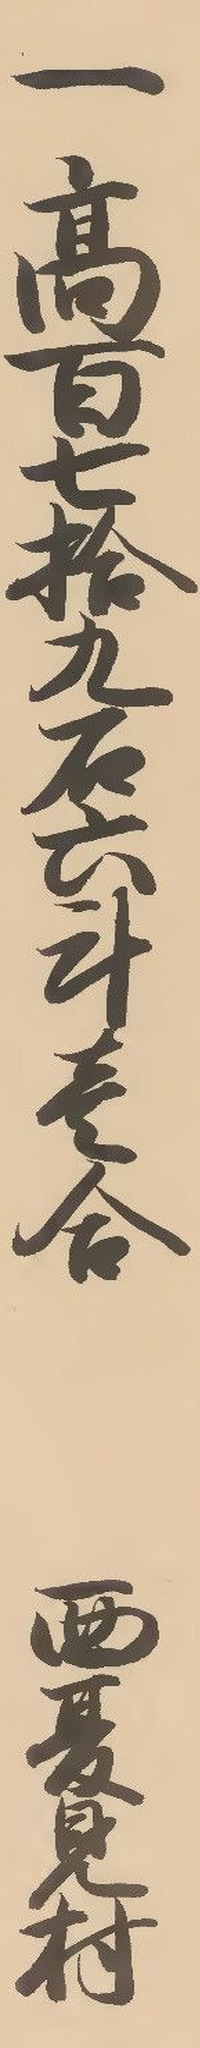一高百七拾九石六斗壱合西夏見村
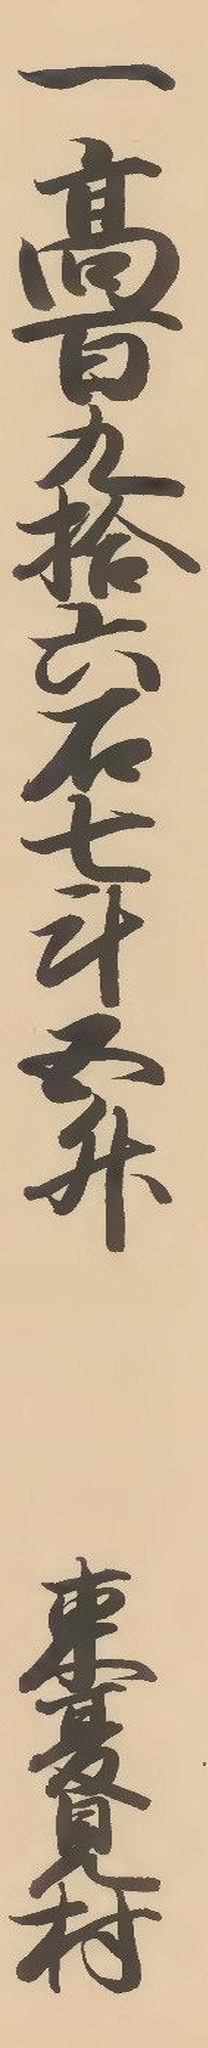一高百九拾六石七斗五升東夏見村
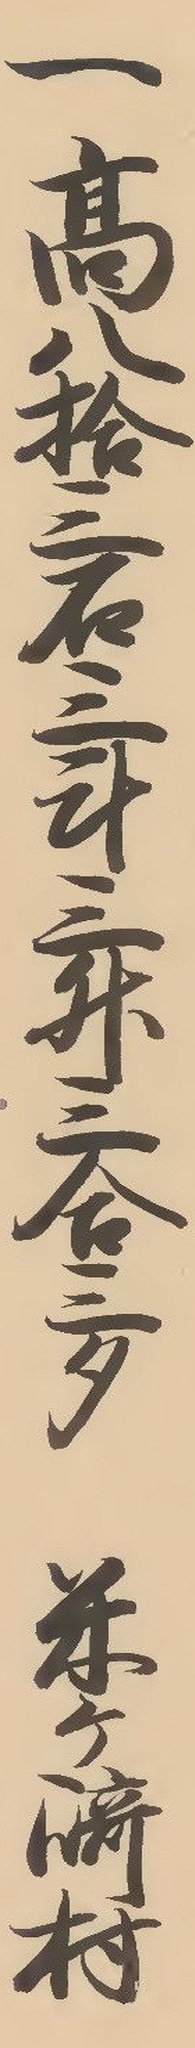一高八拾三石三斗三升三合三勺米ヶ崎村

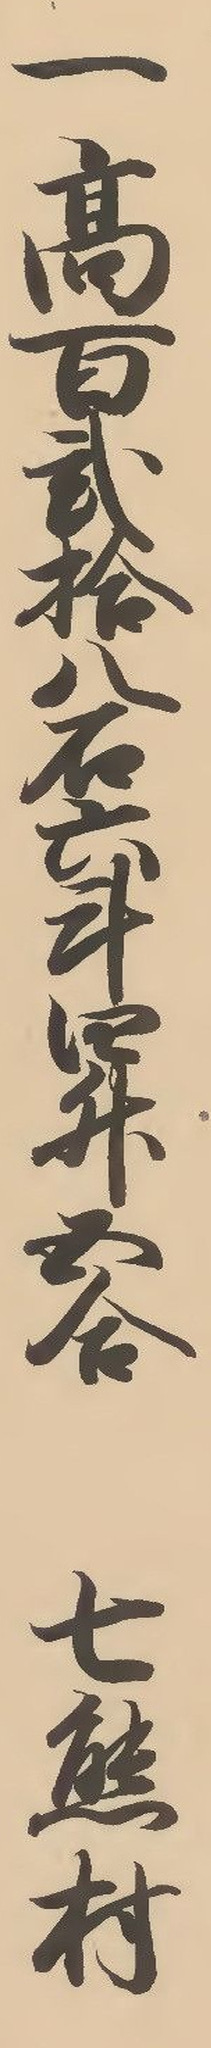一高百弐拾八石六斗四升五合七熊村
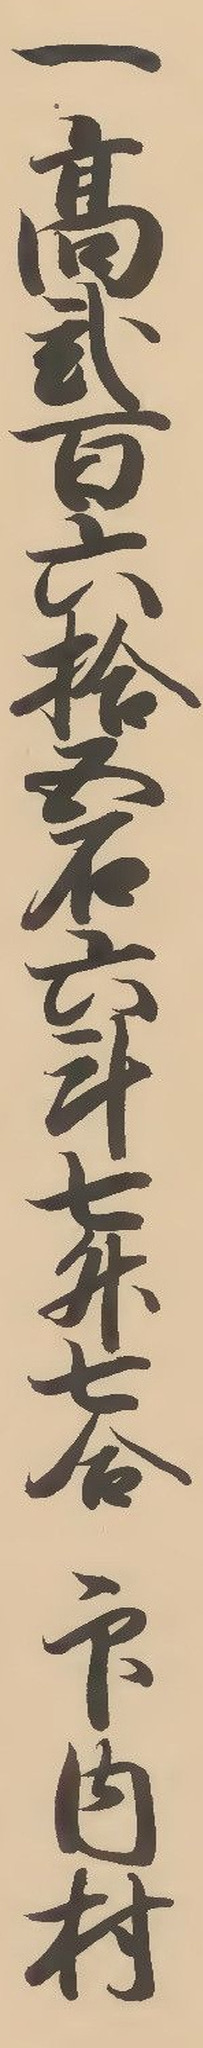一高弐百六拾五石六斗七升七合印内村
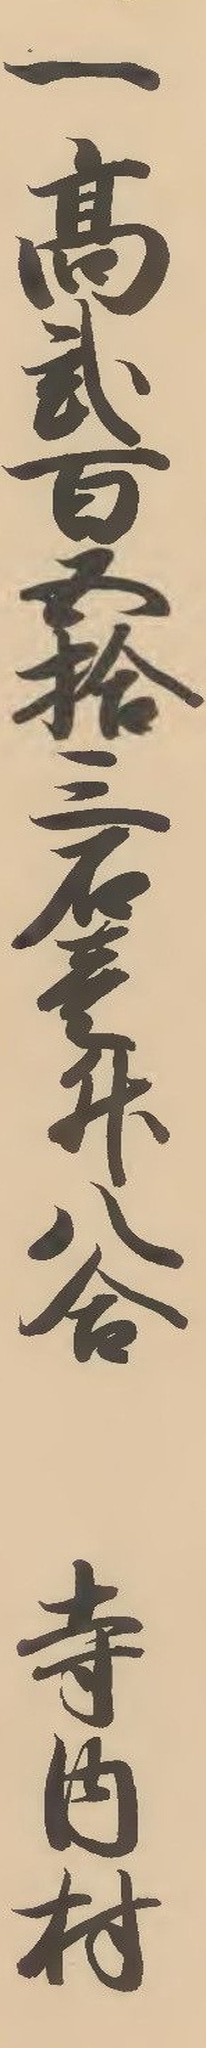一高弐百五拾三石壱升八合寺内村
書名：下総国郷帳
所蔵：国立公文書館 National Archives of Japan
